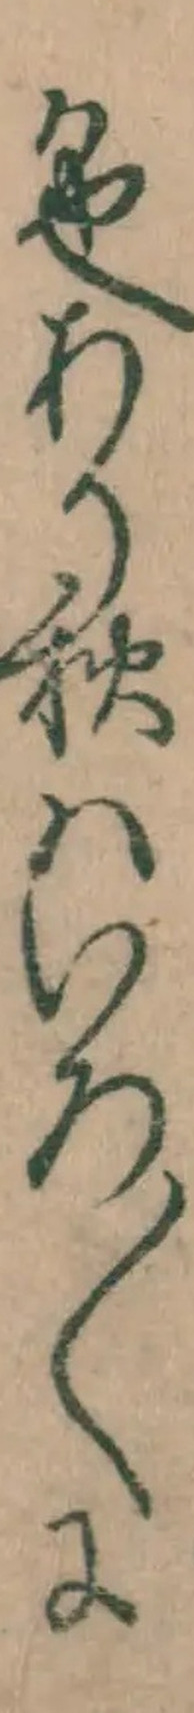色あり秋はいろ〳〵に
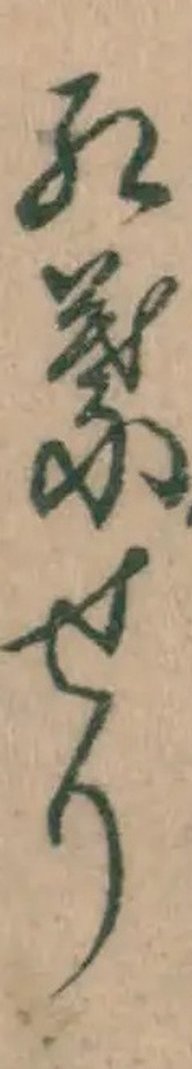紅葉せり
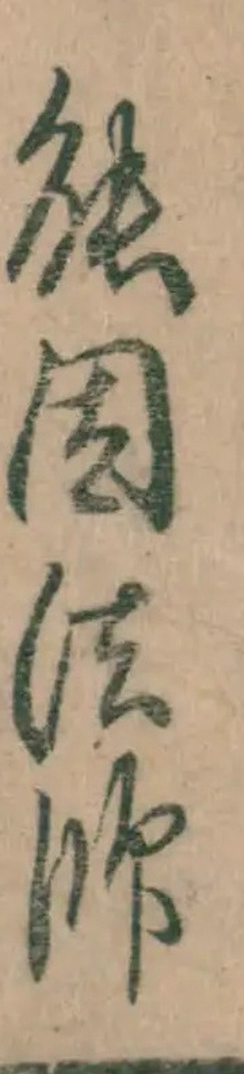能因法師
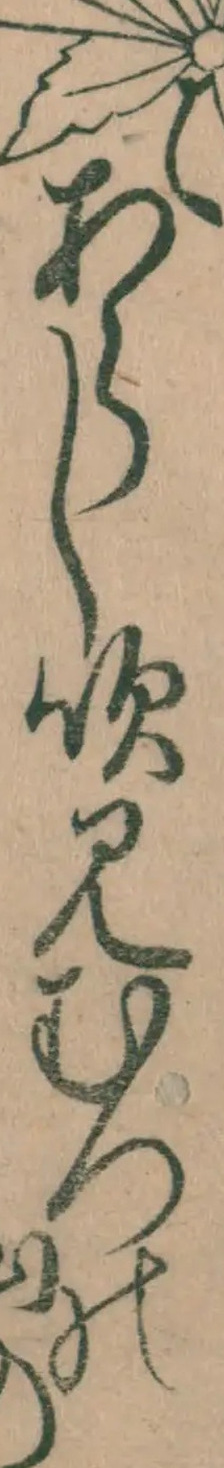あらし吹みむろの
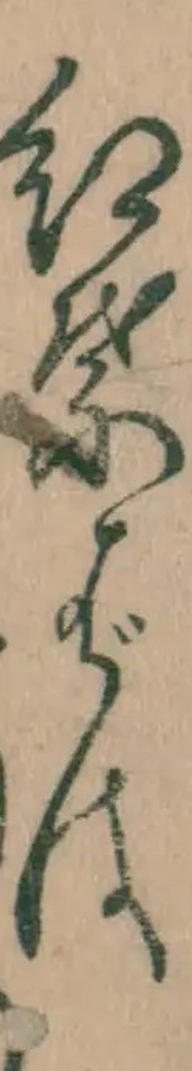紅葉ばは
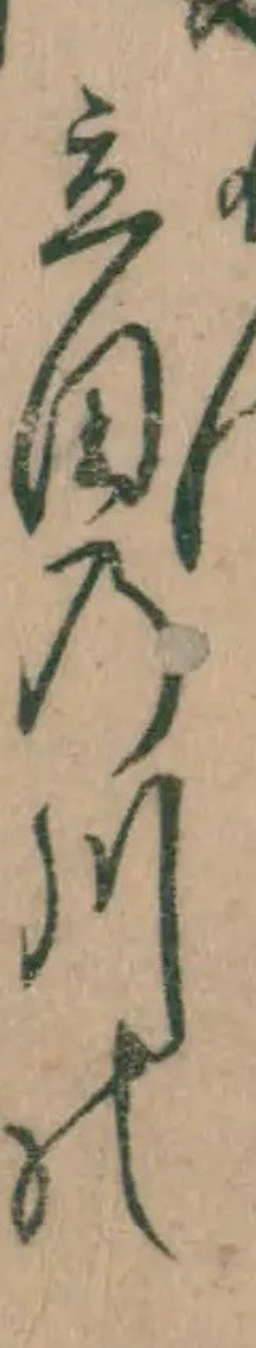立田の川の
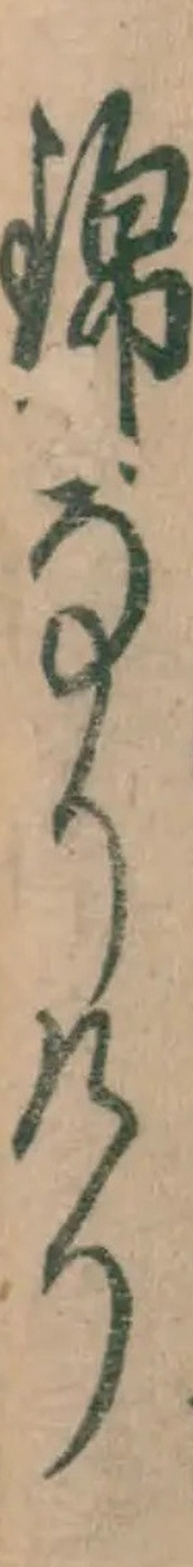錦なりけり
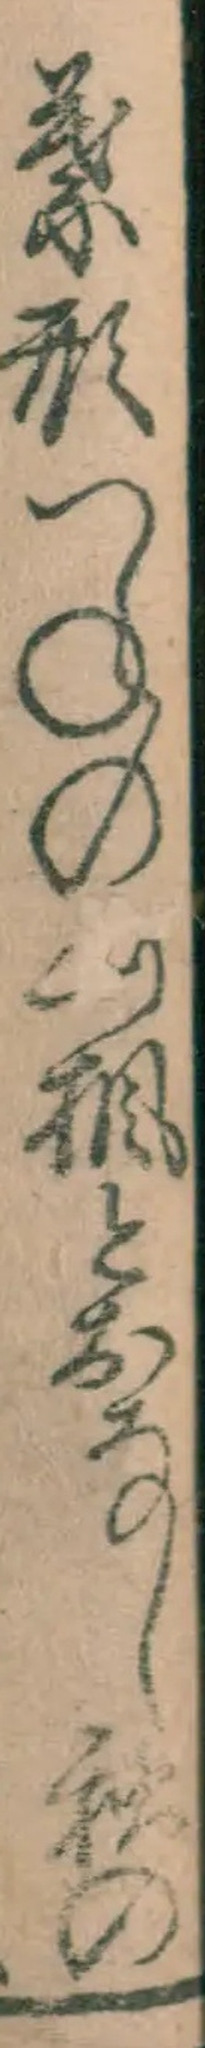立田葉形つねの山楓とおなし秋の
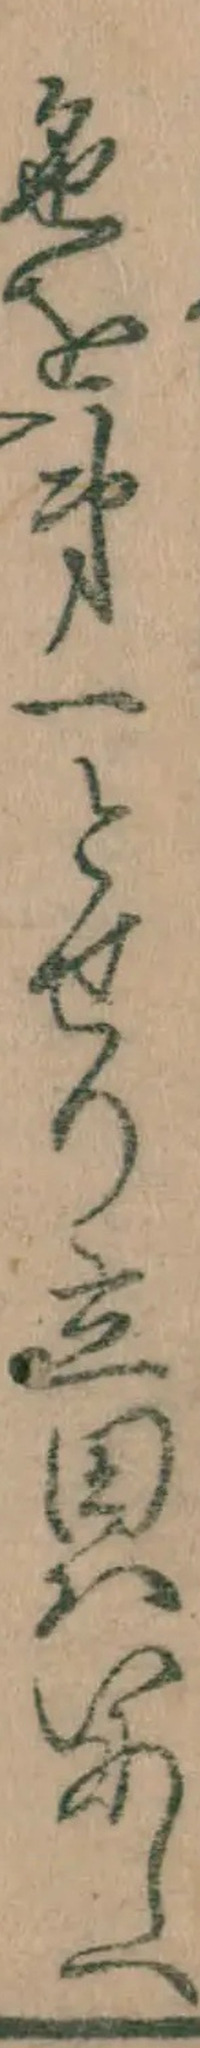色を第一とせり立田はいにしへ
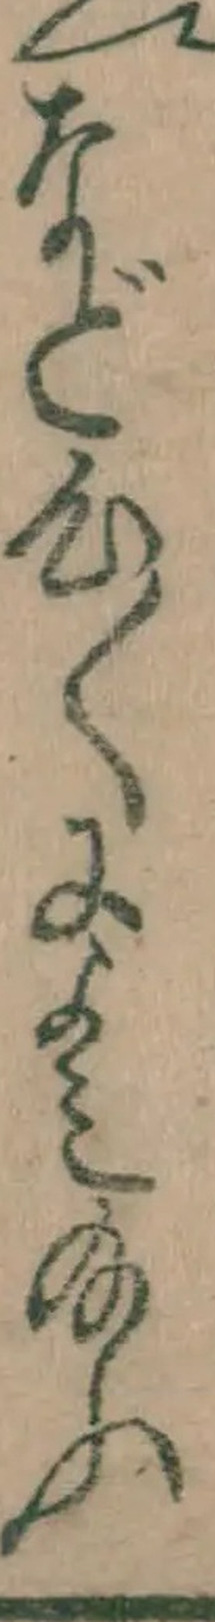など心〳〵によみ給ふ

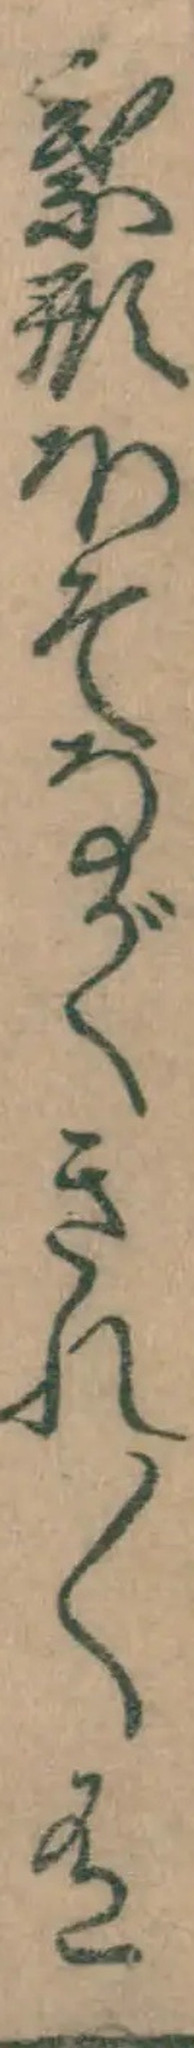侘人葉形ほそながくきれ〳〵有
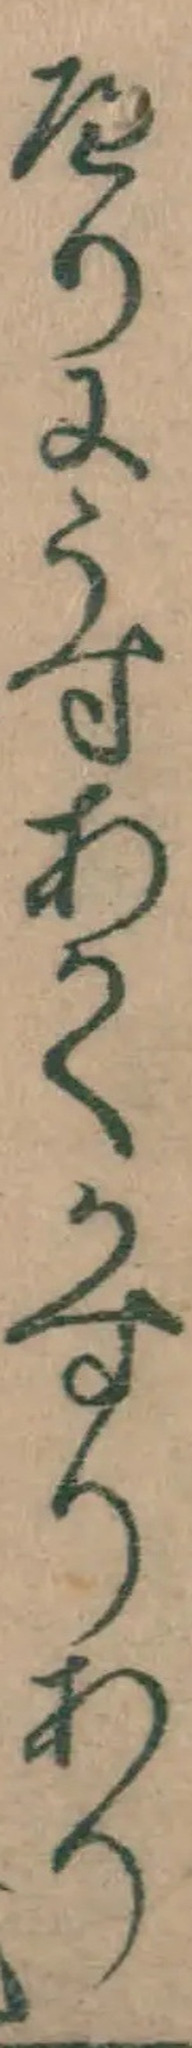へりにうすあかくかすりあり
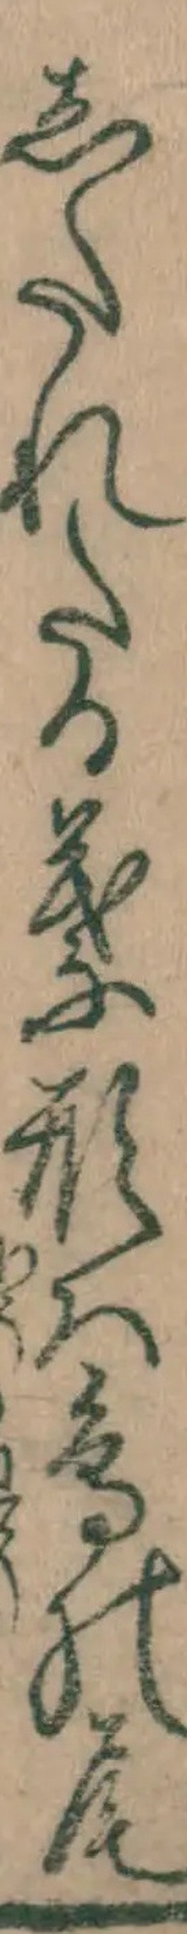したれたる葉形は鳥の尾
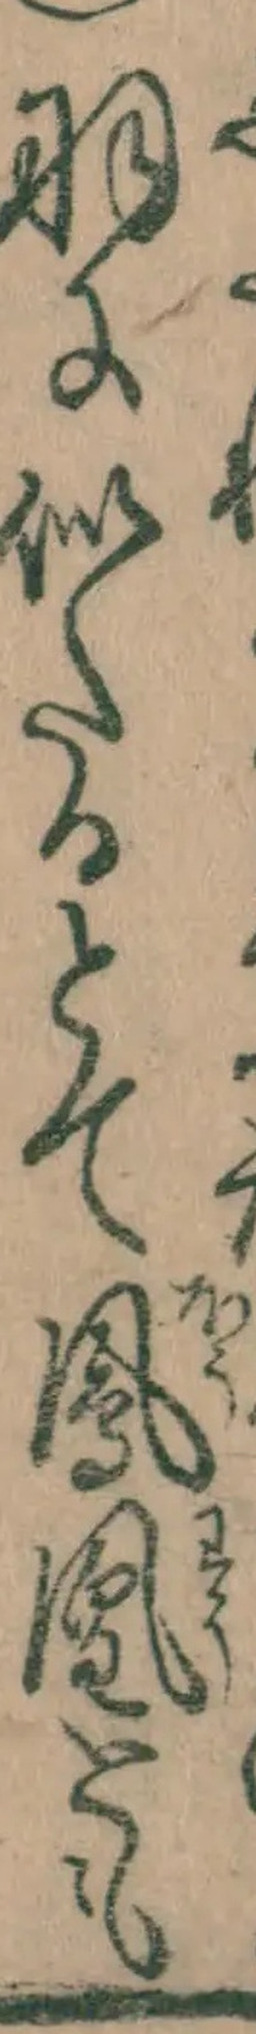羽に似たるとて鳳凰とも
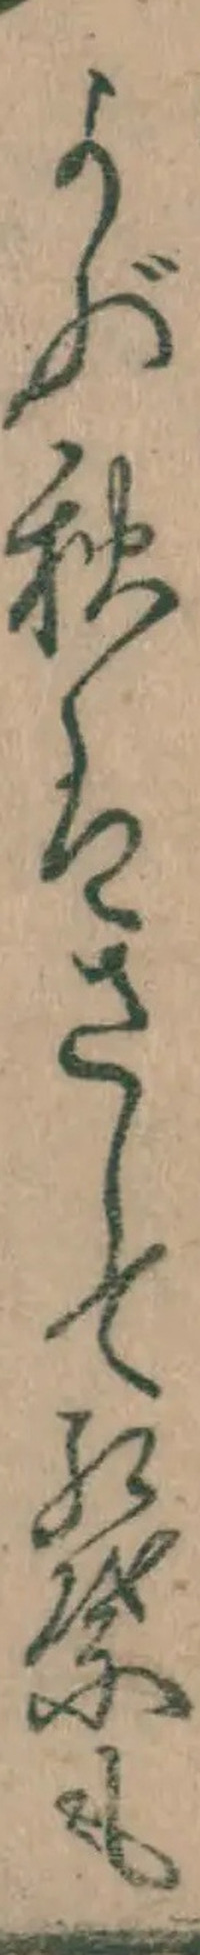よぶ秋はさして紅葉も
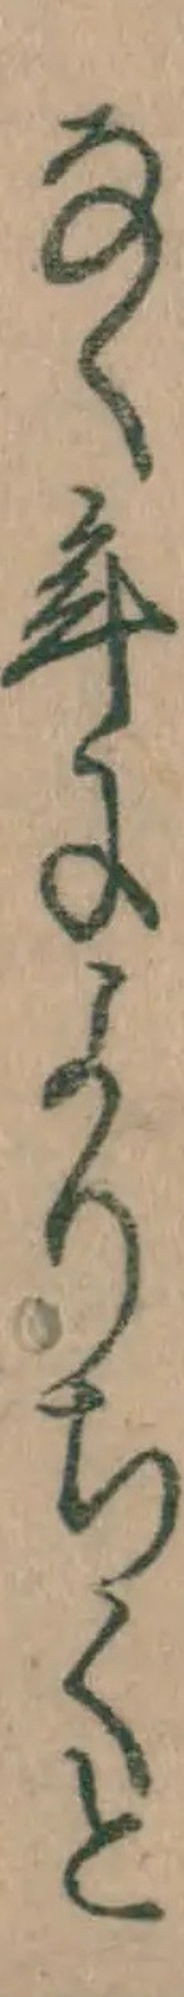なく年によりちくと
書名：紅葉集
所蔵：国立国会図書館 National Diet Library, JAPAN
